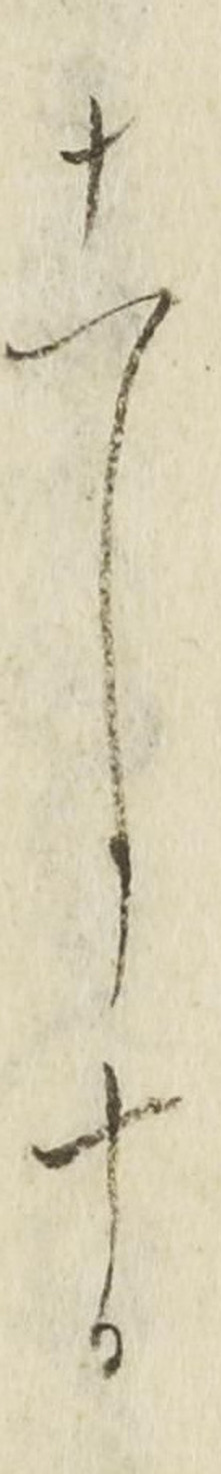十一月十日
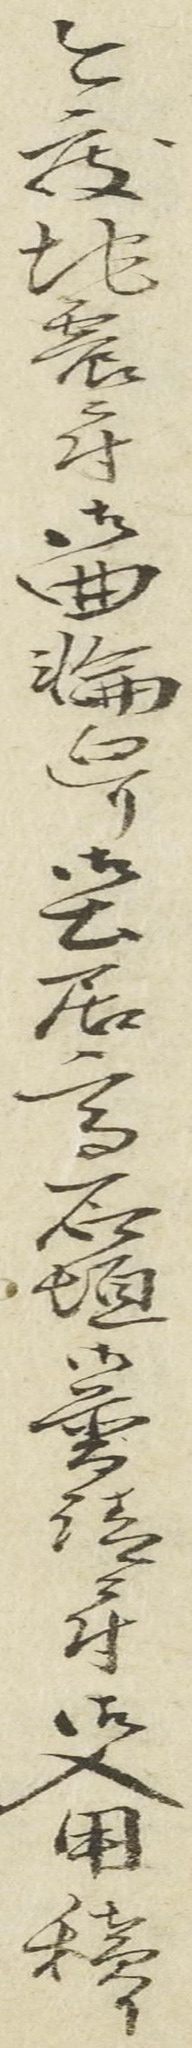今度地震ニ付御曲輪回り御土居高石垣御普請ニ付御入用積り
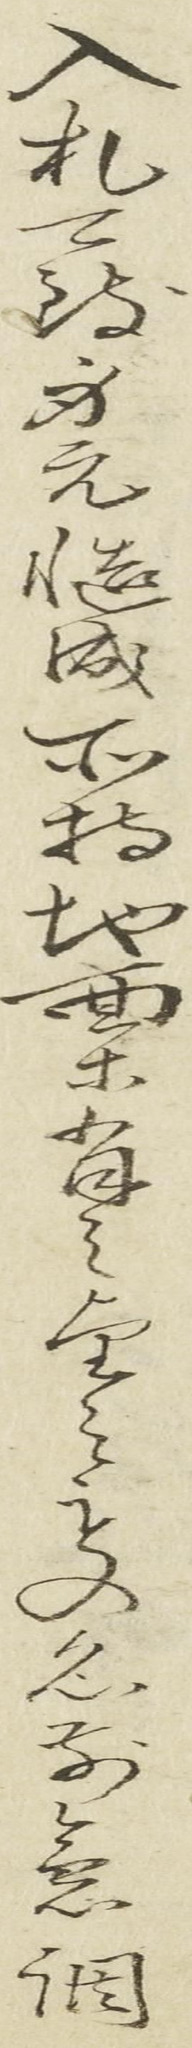入札可致身元慥成所持地面等有之望之もの名前急調
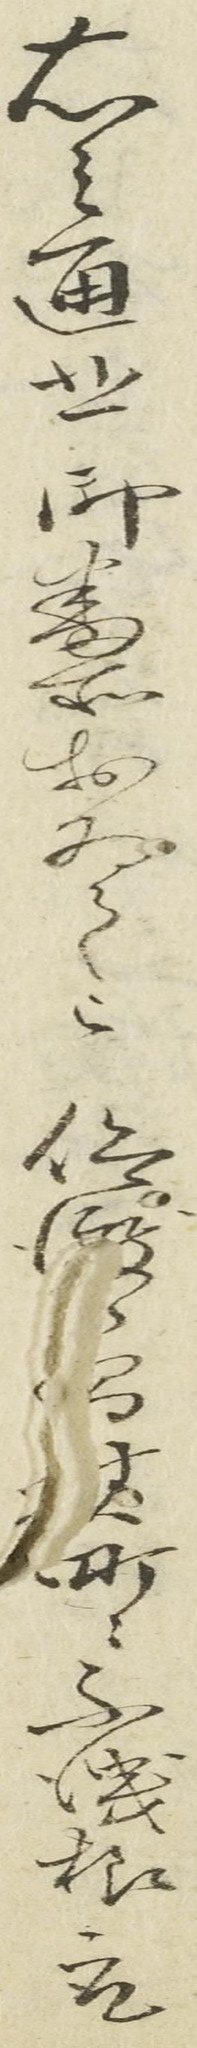右之通北御番所おいて被仰渡候間町ニ不洩様取
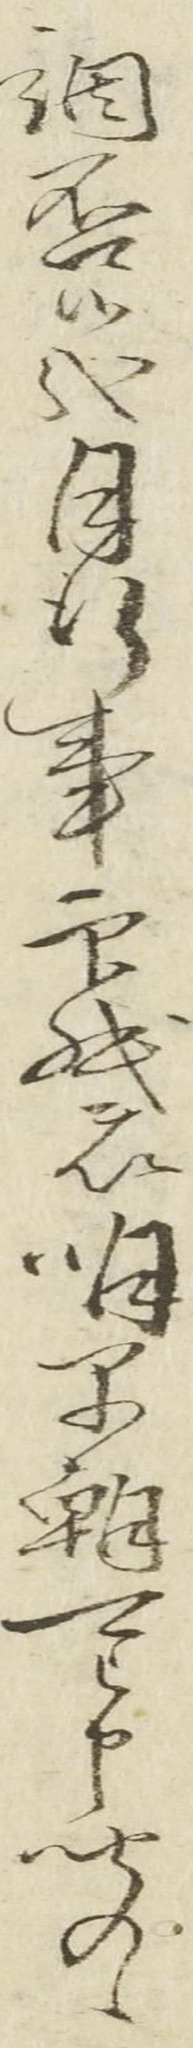調否候哉月行事印紙ヲ以明早朝可被申聞候
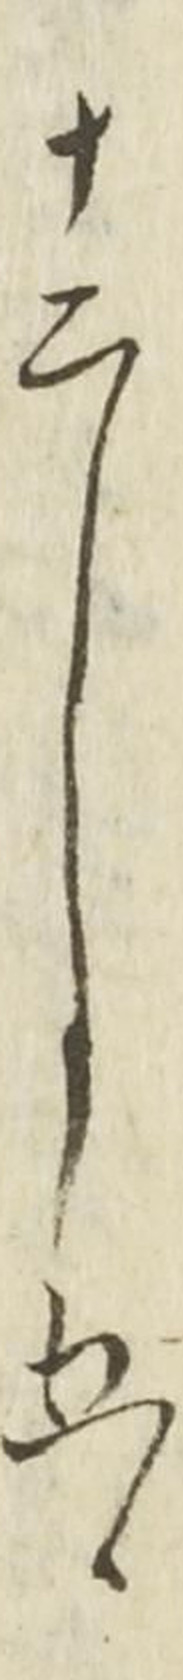十二月五日
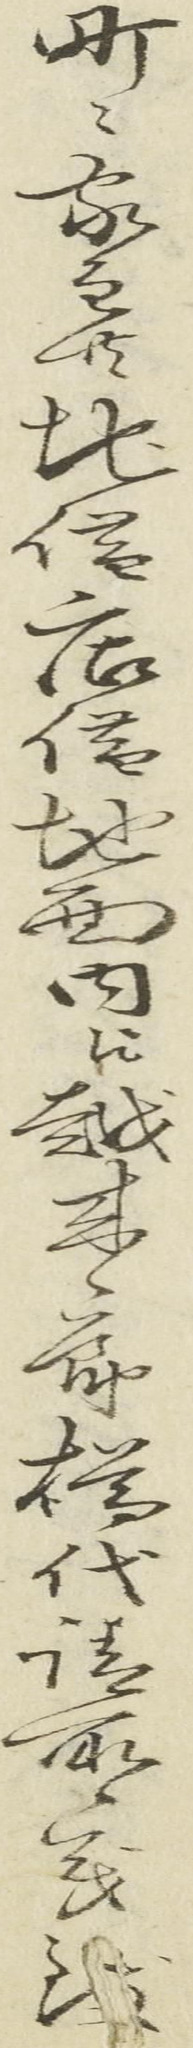町々家主共地借店借地面内え越来候節樽代請取候義致
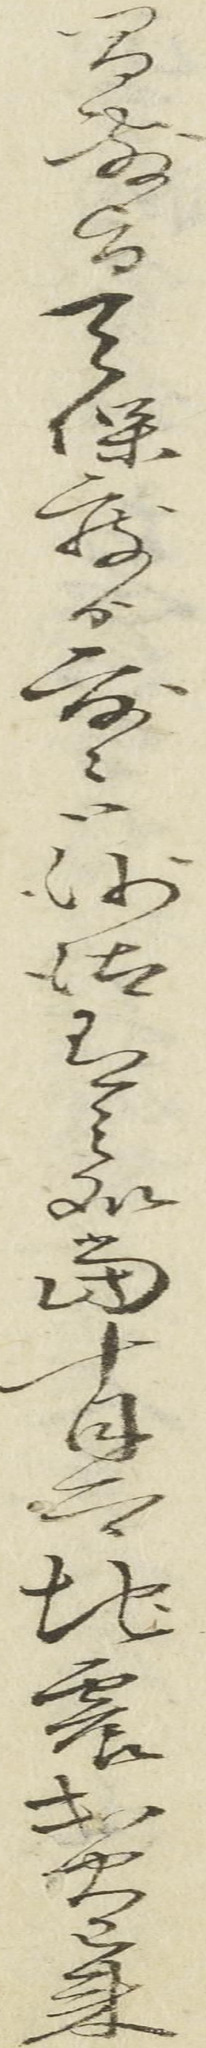間敷旨天保度ゟ度々御沙汰有之候処当十月二日地震出火已来
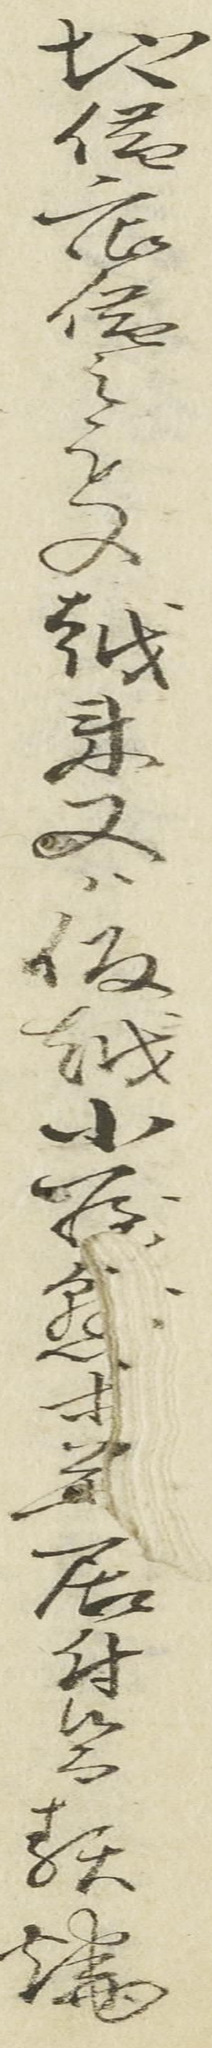地借店借之もの越来又ハ仮越小屋懸等居付候而類焼
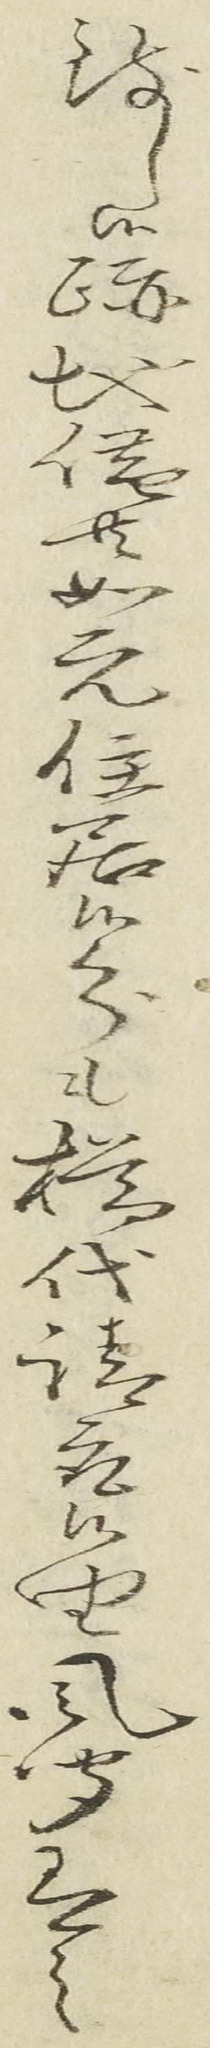致し候跡地共如元住居候分も樽代請取候由風聞有之
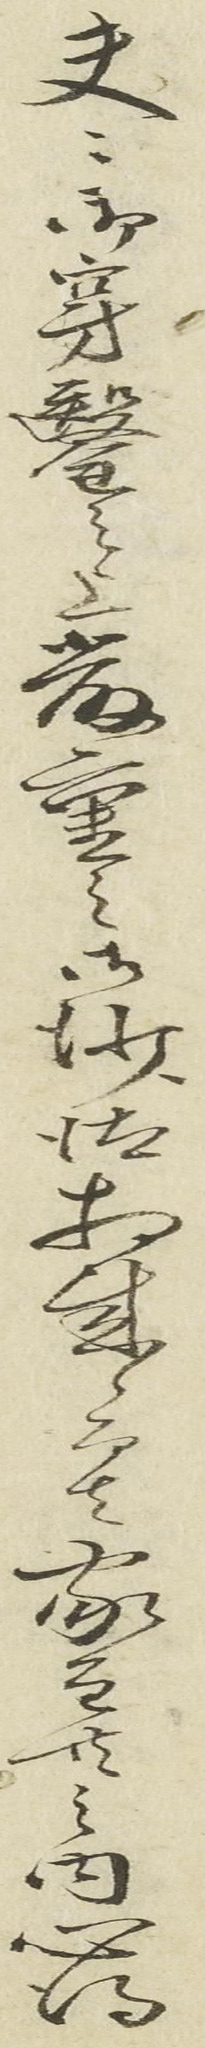夫々御穿鑿之上厳重之御沙汰相成候而は家主共之内心得
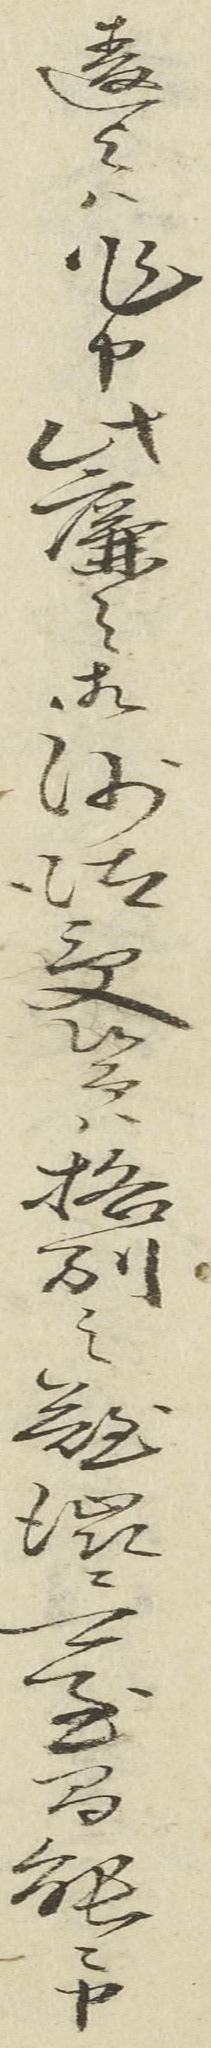違とハ乍申此廉之御沙汰受候而ハ格別之難渋ニ可至間能々申
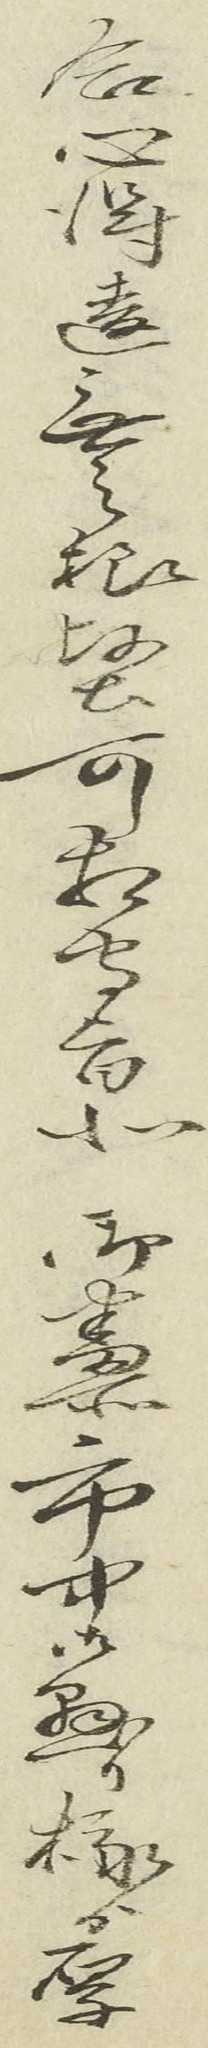合心得違無之様堅可相守旨北御番所市中御懸り様ゟ厚
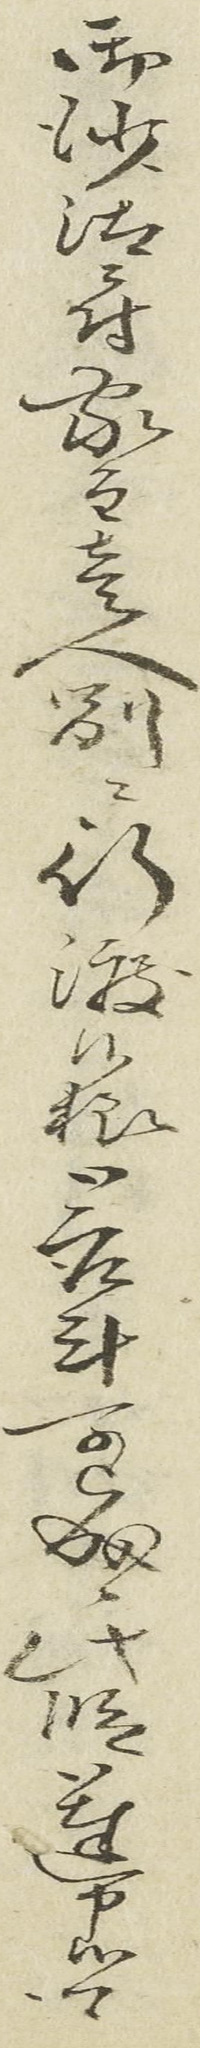御沙汰ニ付家主壱人別ニ行渡候様御取斗可被成候此段御達申候以上
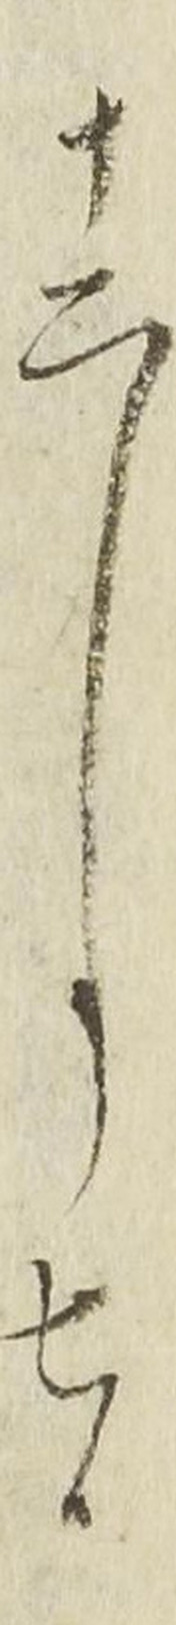十二月七日
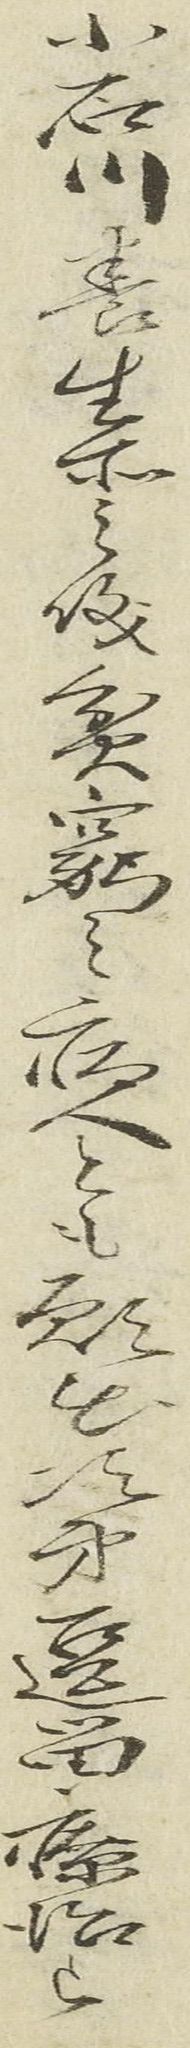小石川養生所之儀貧窮之病人とも願出次第逗留療治被
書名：安政二乙卯年十月二日大地震之事
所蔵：東京大学地震研究所図書室 Earthquake Research Institute Library, The University of Tokyo, JAPAN
